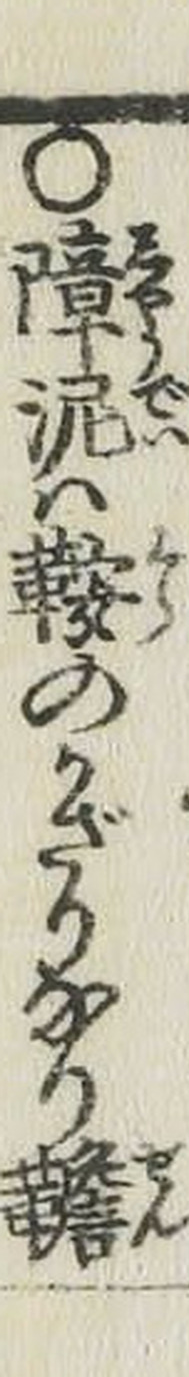○障泥は鞍のかざりなり韂
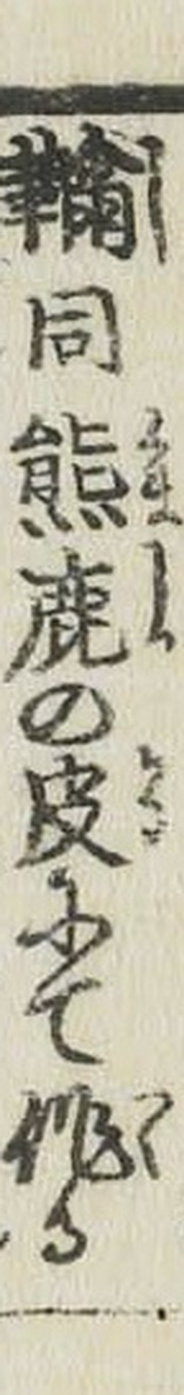𩍲同熊鹿の皮にて作る
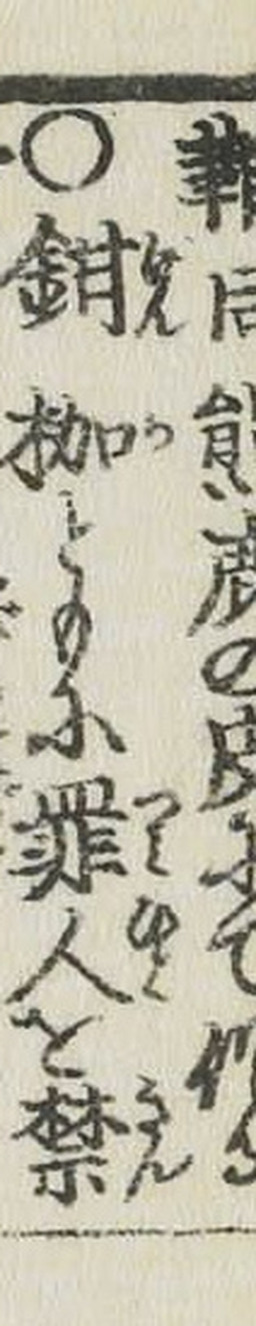○鉗枷ともに罪人を禁
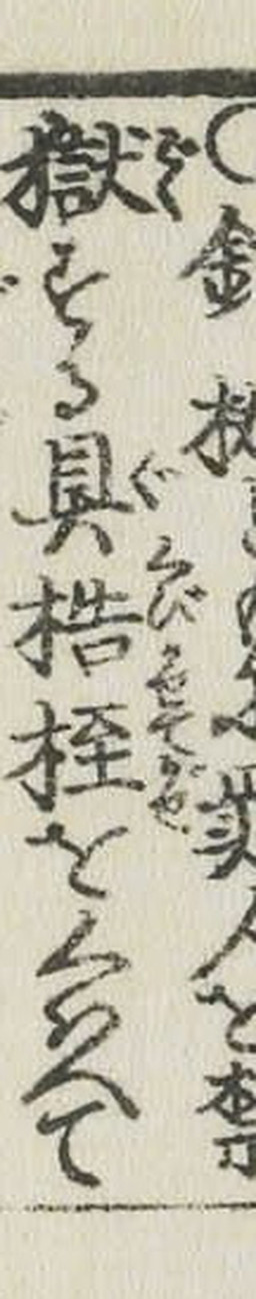獄する具梏桎をくはへて
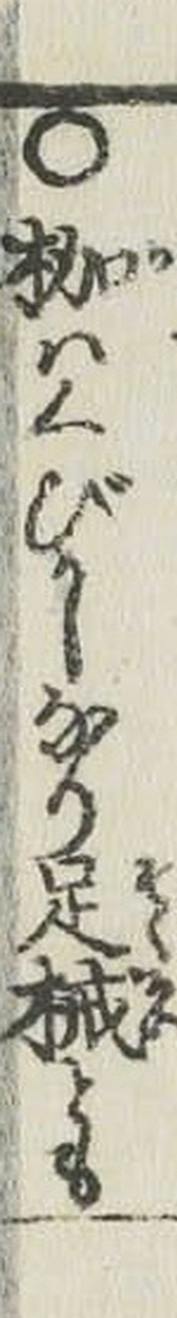○枷はくびかしなり足械とも
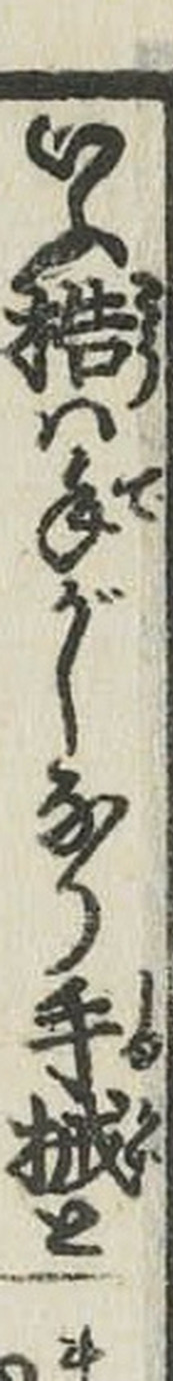いふ梏は手がしなり、手械と
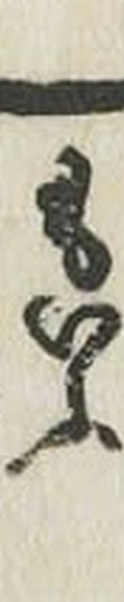もいふ
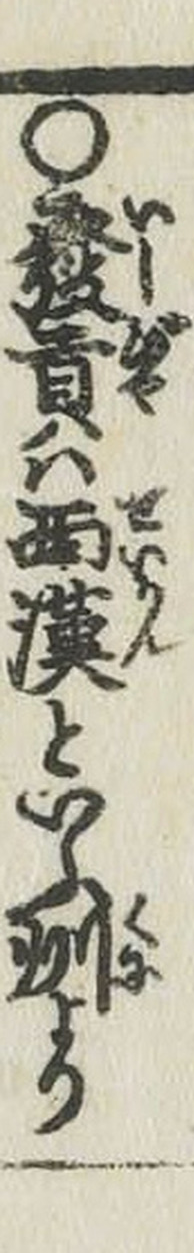○発頁は西漢といふ州より
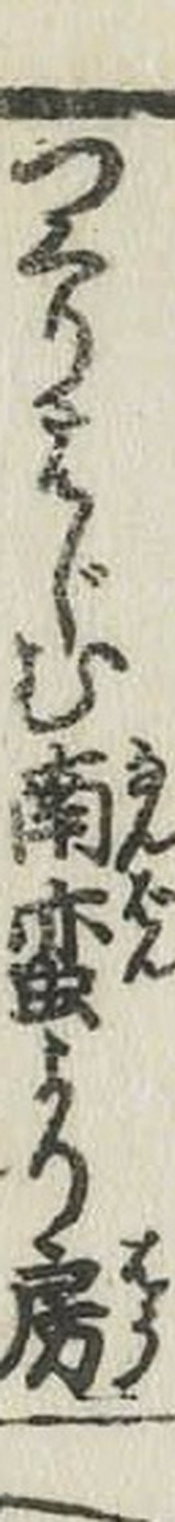つくりはじむ南蛮より房
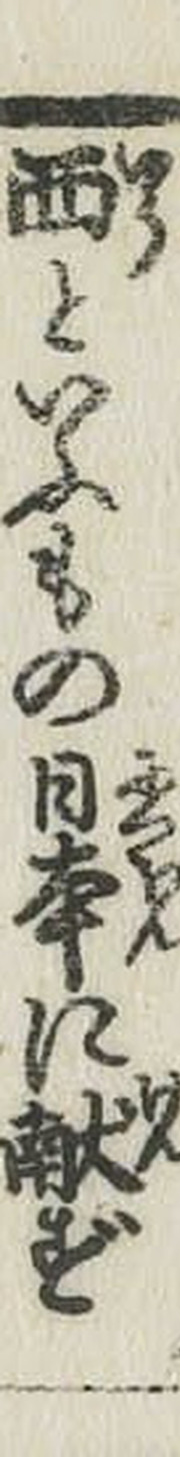西といふもの日本に献ず
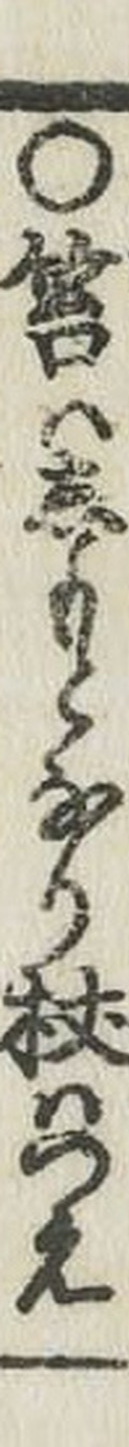○笞はしもとなり杖はつえ
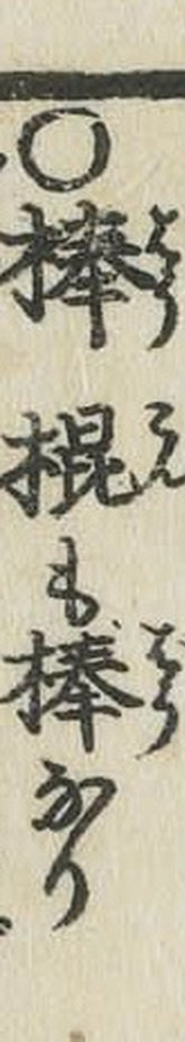○棒棍も棒なり
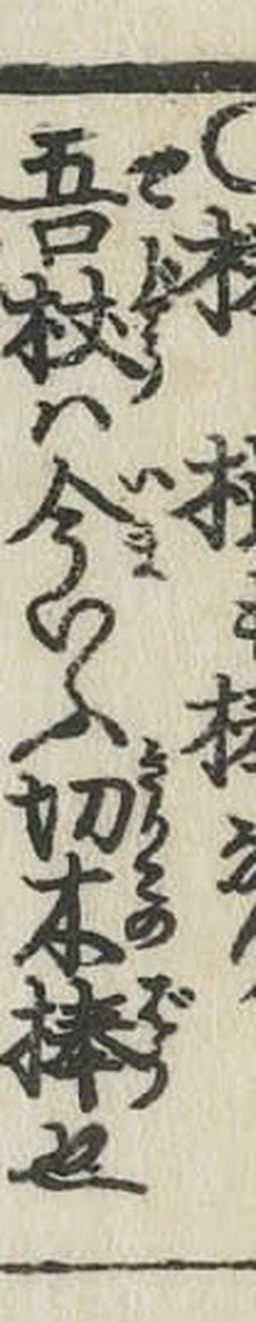吾杖は今いふ切木棒也
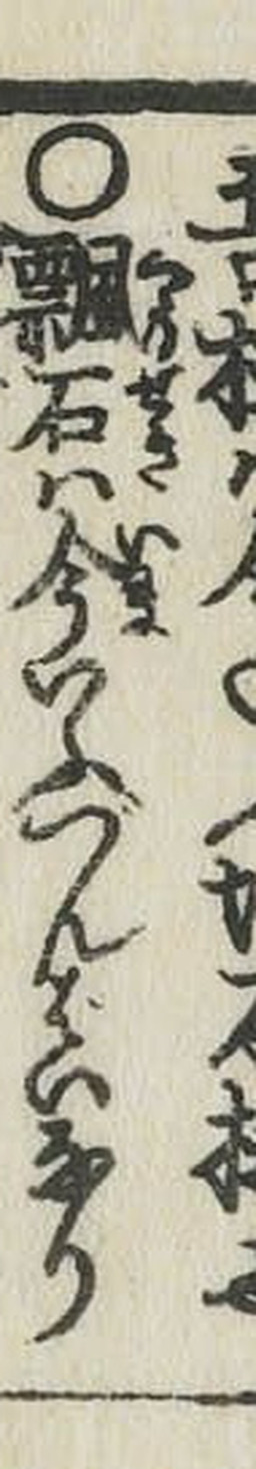○飄石は今いふづんばいなり
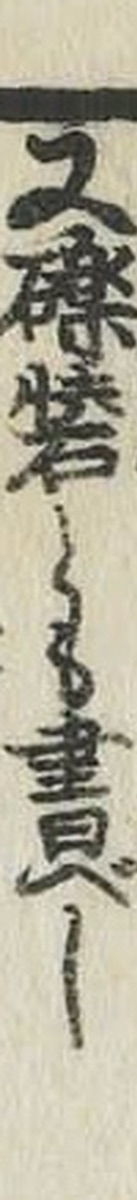又礫碆とも書べし
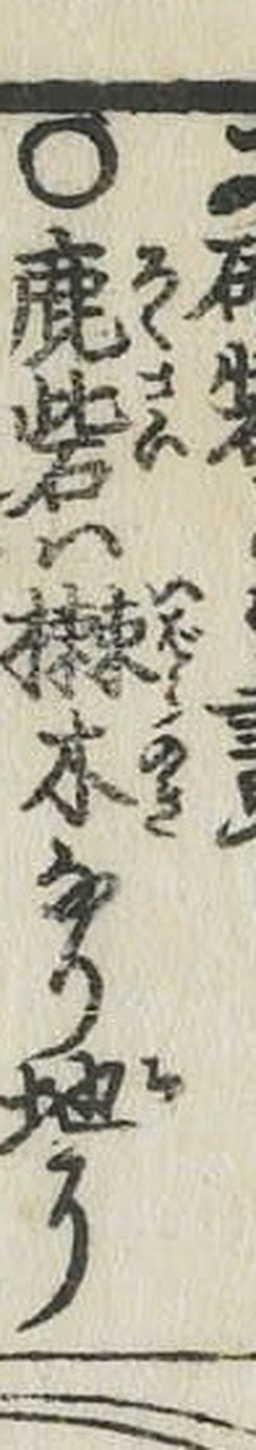○鹿砦は▢木なり地に
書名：増補頭書訓蒙図彙大成 10巻 5:巻之9-11
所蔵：東京学芸大学教育コンテンツアーカイブ
